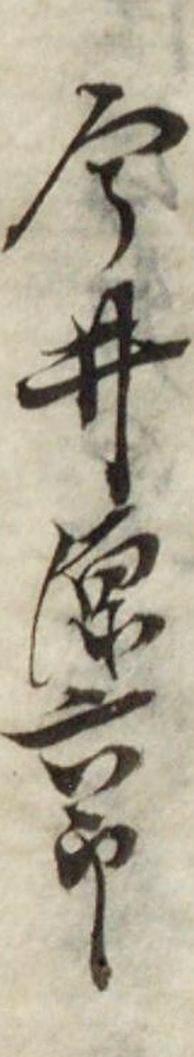今井源六郎
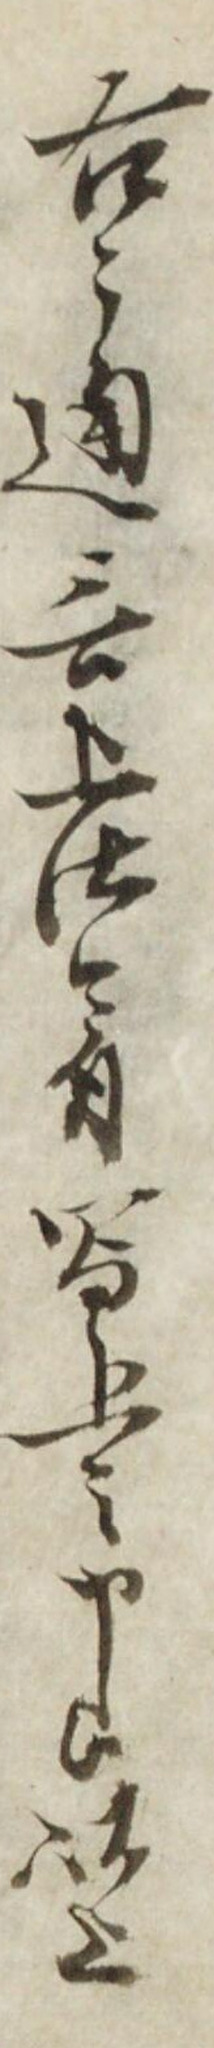右之通言上仕に付写上之申候以上
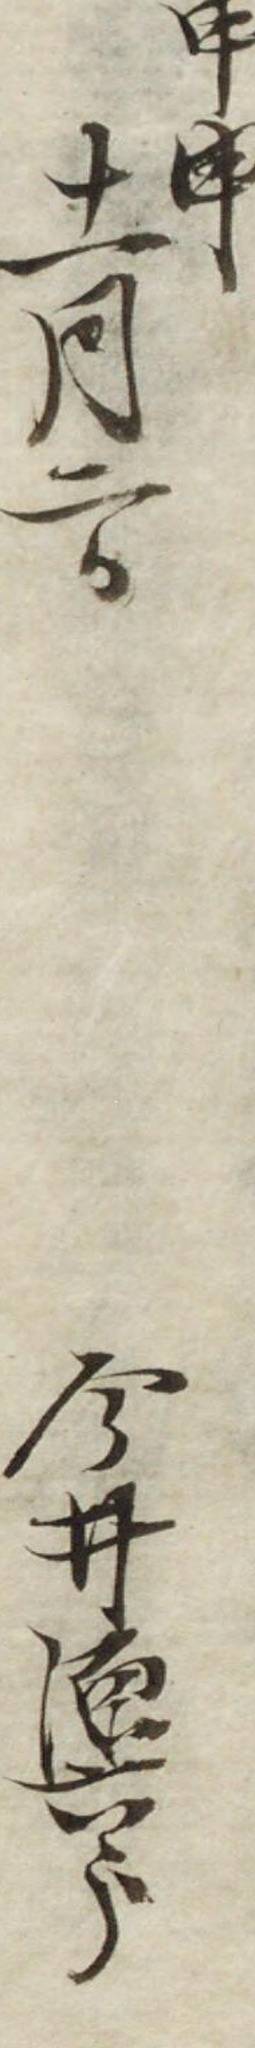十一月二日今井源六郎
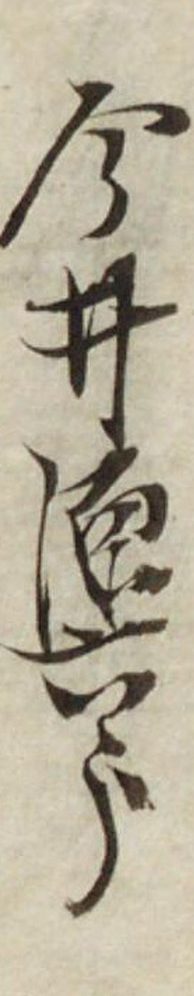今井源六郎
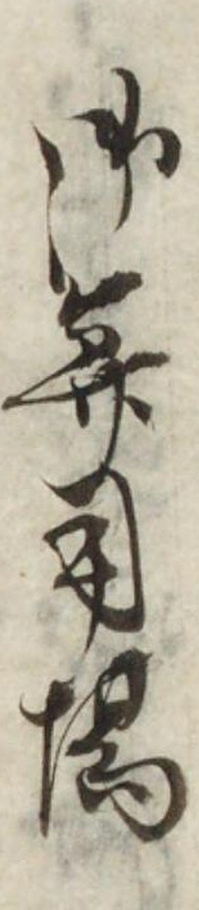御算用場
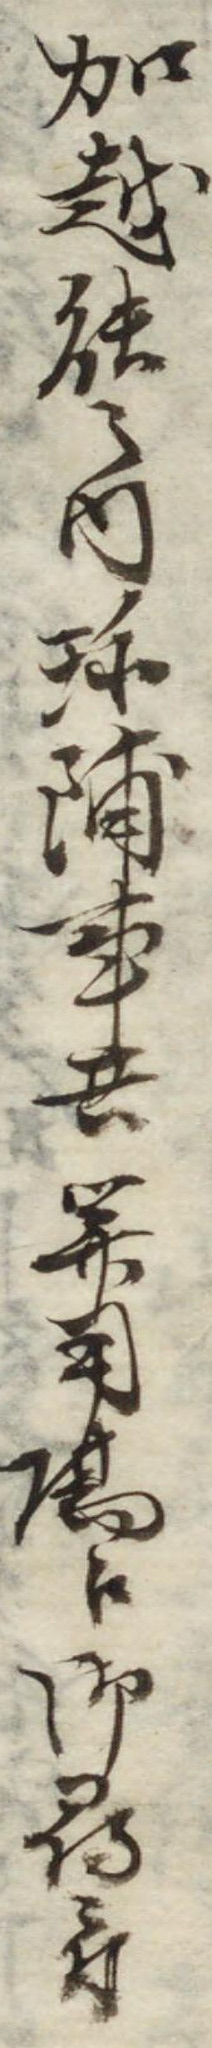加越能之内珎鋪事共算用場え御尋に付
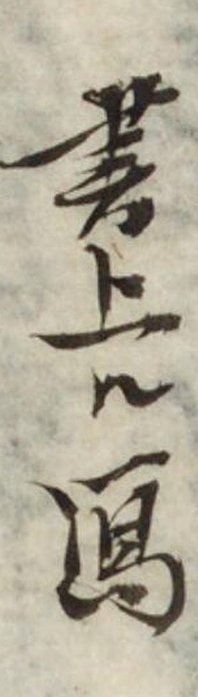書上る写
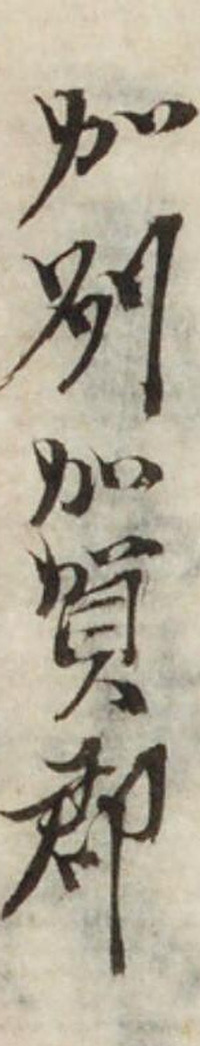加州加賀郡
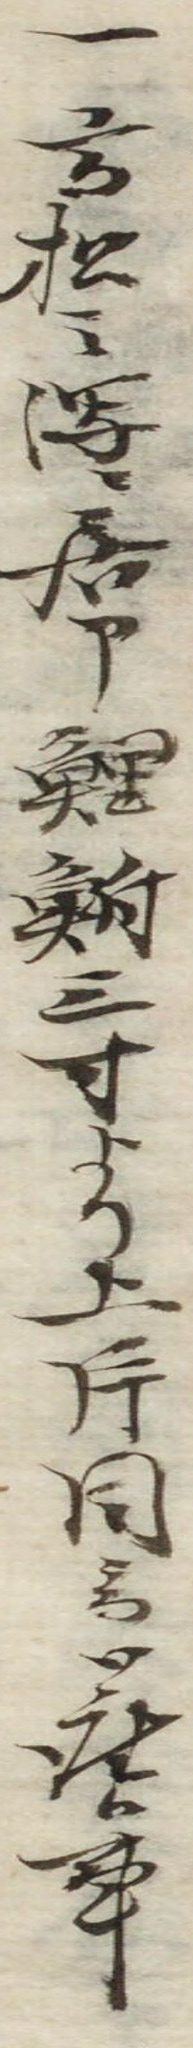一高松之潟に居申鯉鮒三寸より上斤同に而御座候事
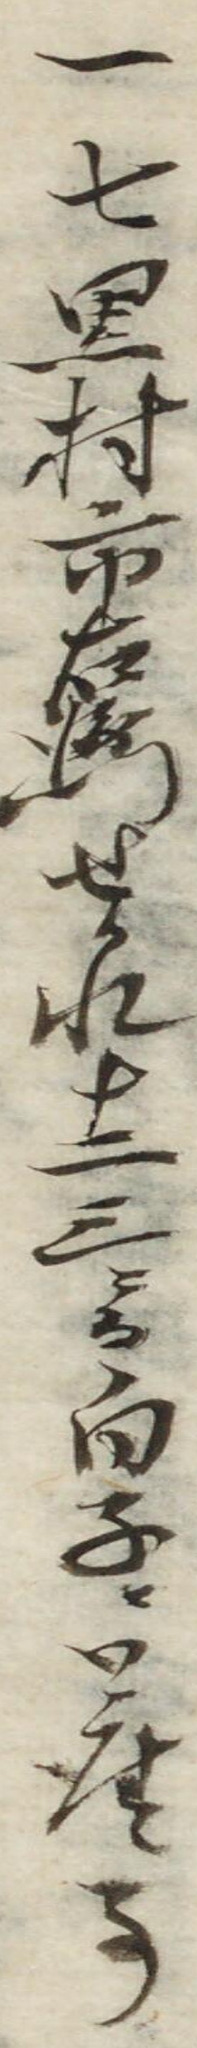一七里村市右衛門せかれ十二三に而白子に御座候事
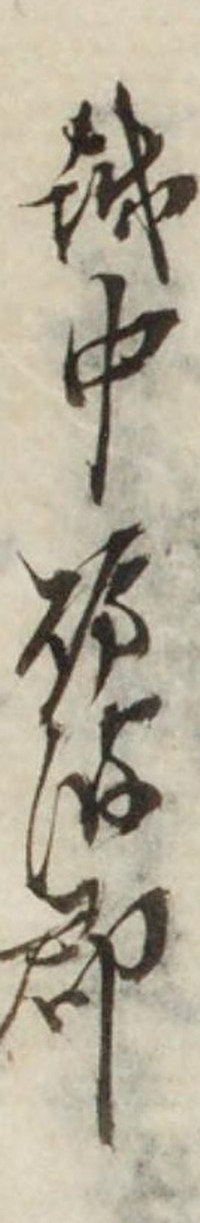越中砺波郡
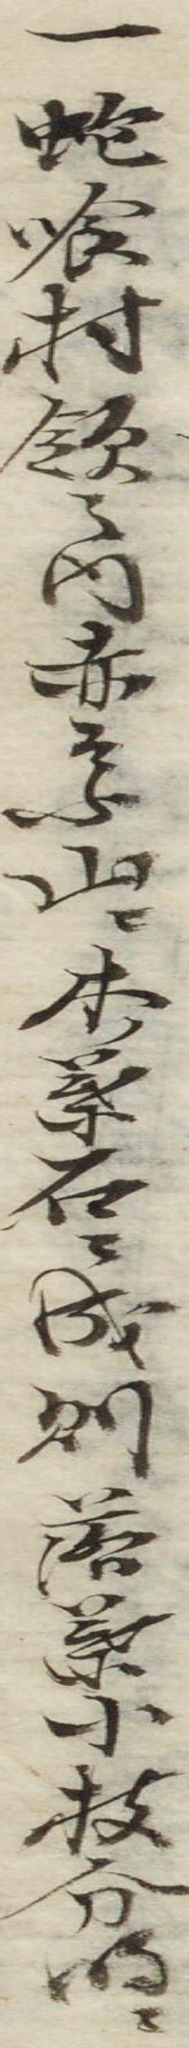一蛇喰村領之内赤そふ山に木ノ葉石に成則落葉小枝分明に
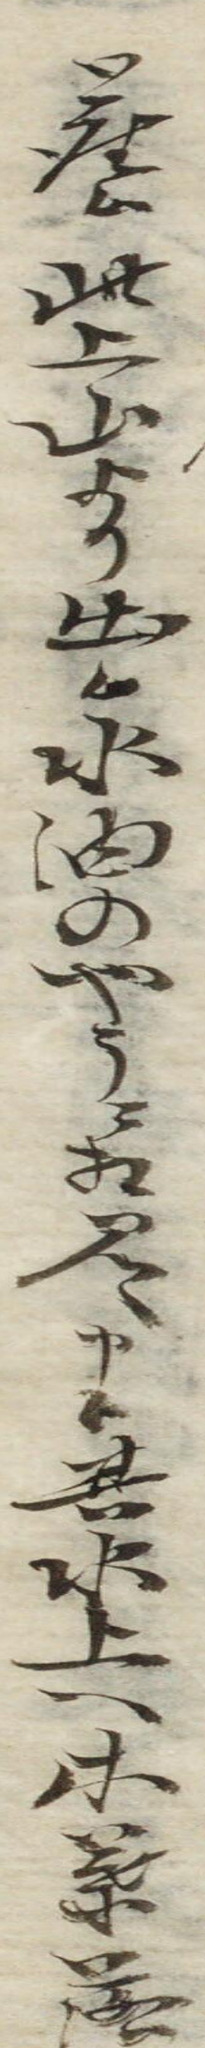御座候此上山より出候水油のやうに相見へ申候其水上へ木葉落
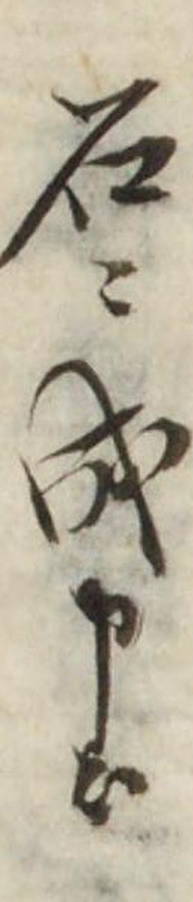石に成申候
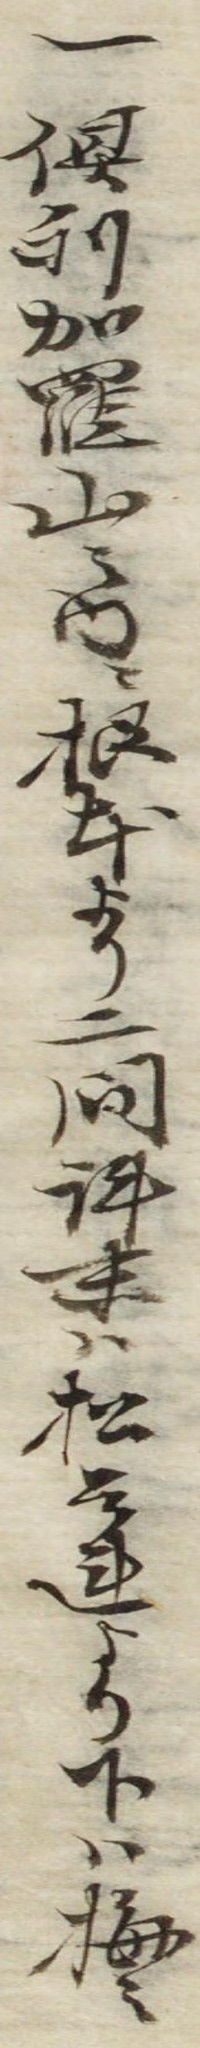一倶利伽羅山之内に根本より二間許末は松それより下は梅之
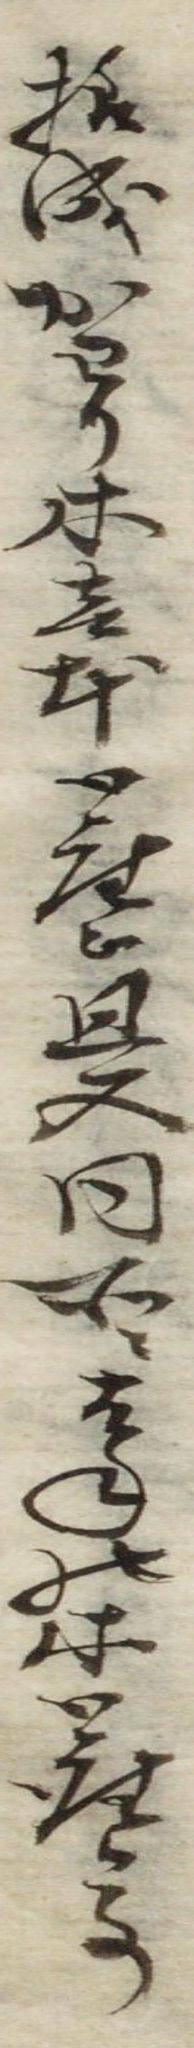様成かわり木壱本御座候且又同所にはねの木御座候事
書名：加越能旧聞録
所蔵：Ishikawa Prefectural Library
